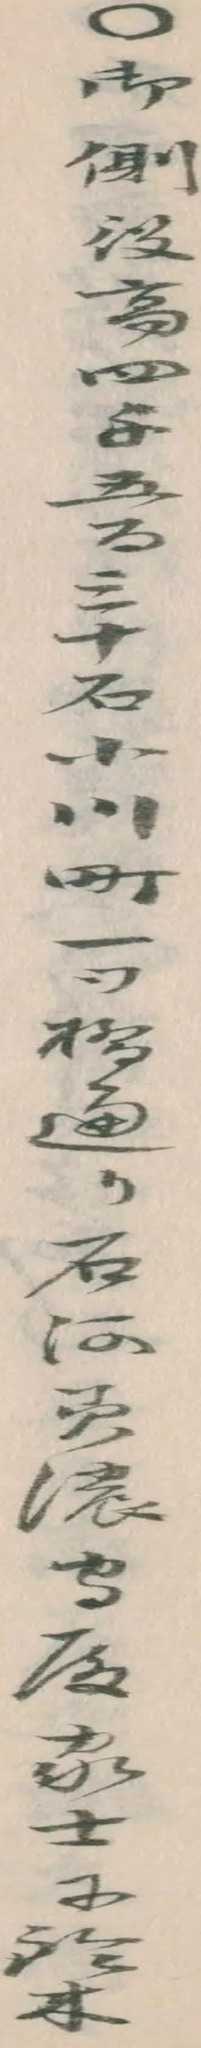〇御側役高四千五百三十石小川町一ツ橋通り石河美濃守殿家士に鈴木
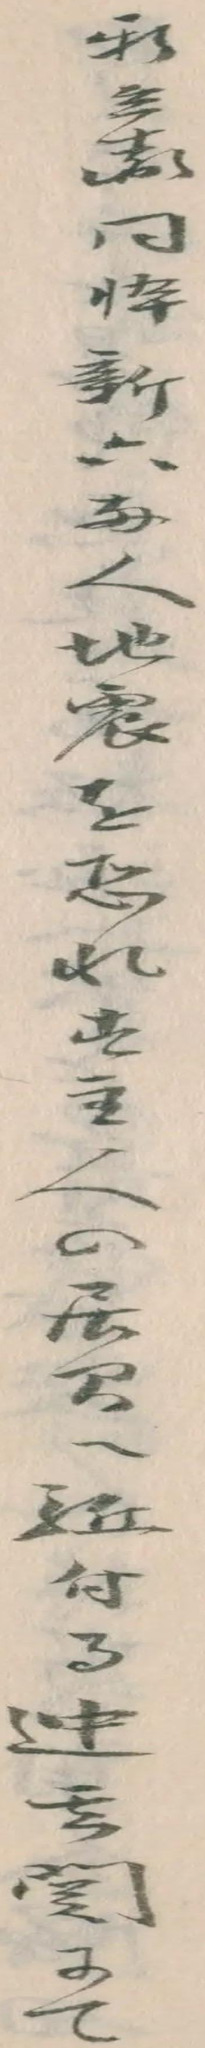新兵衛同忰新六両人地震を恐れす主人の居間へ駈付る迚玄関にて
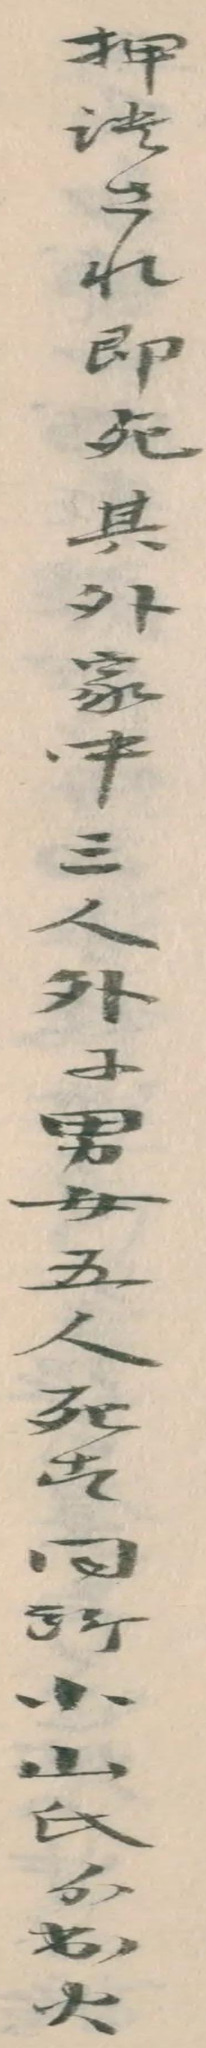押潰され即死其外家中三人外に男女五人死す同所小山氏ゟ出火

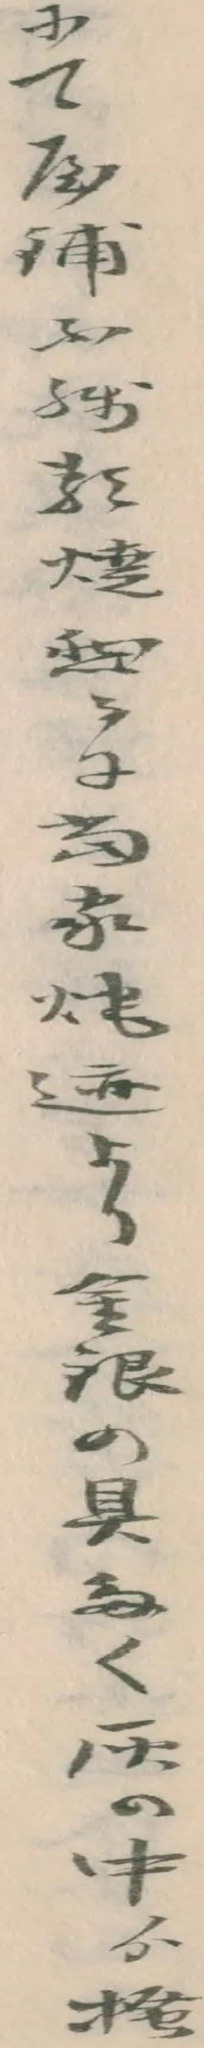にて屋敷不残類焼然るに当家焼迹より金銀の具多く灰の中ゟ搔
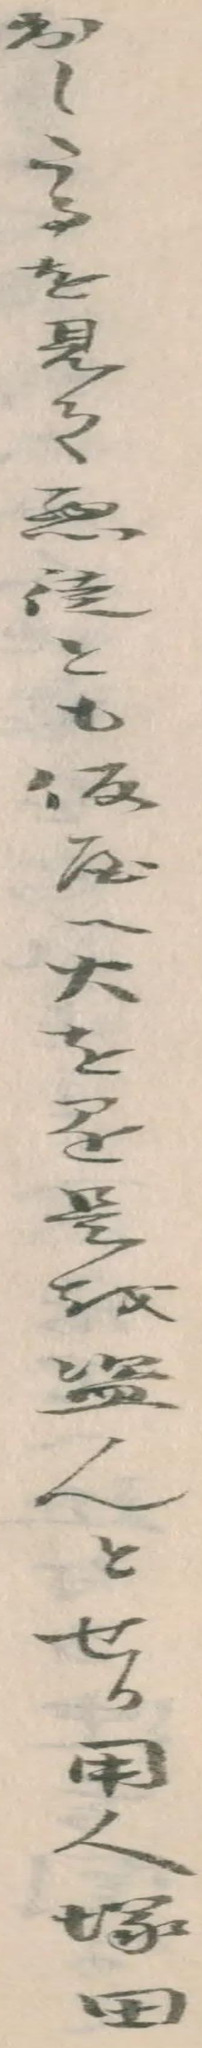出したるを見て悪徒とも仮屋へ火を懸是を盗んとせり用人塚田
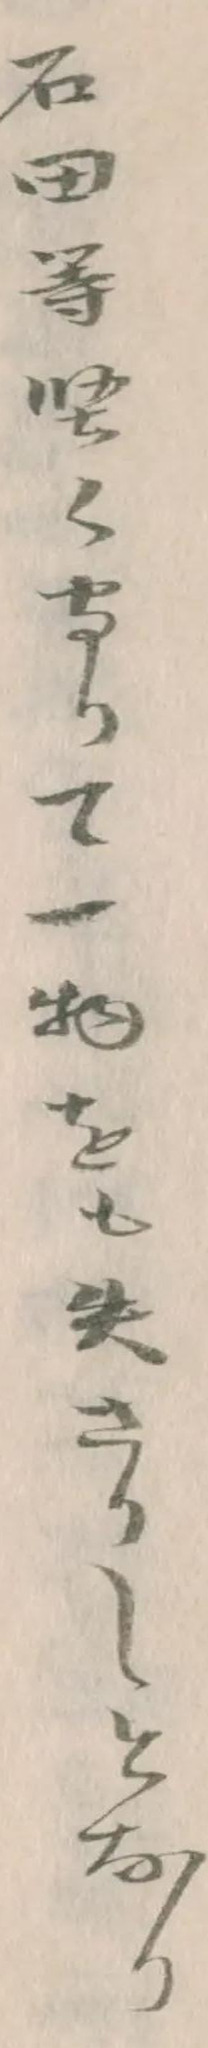石田等堅く守りて一物をも失さりしとなり
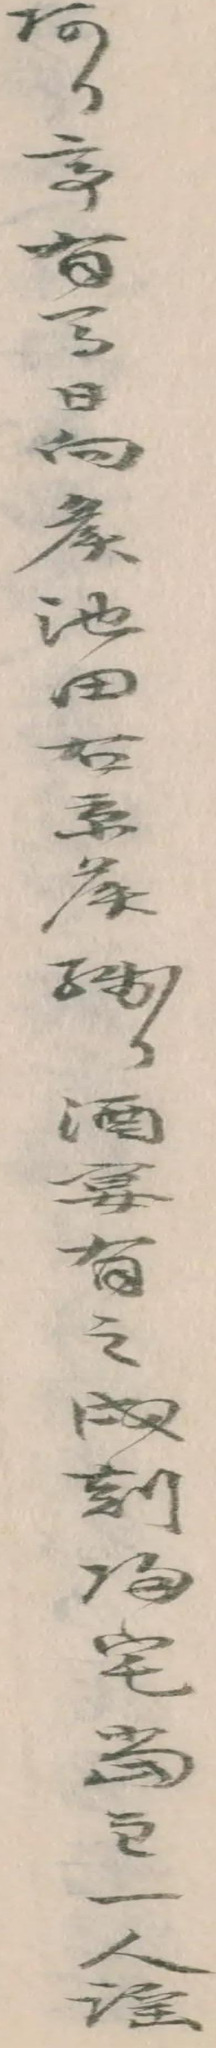ありて有馬日向侯池田右京侯残り酒宴有之戌刻帰宅当主一人謡
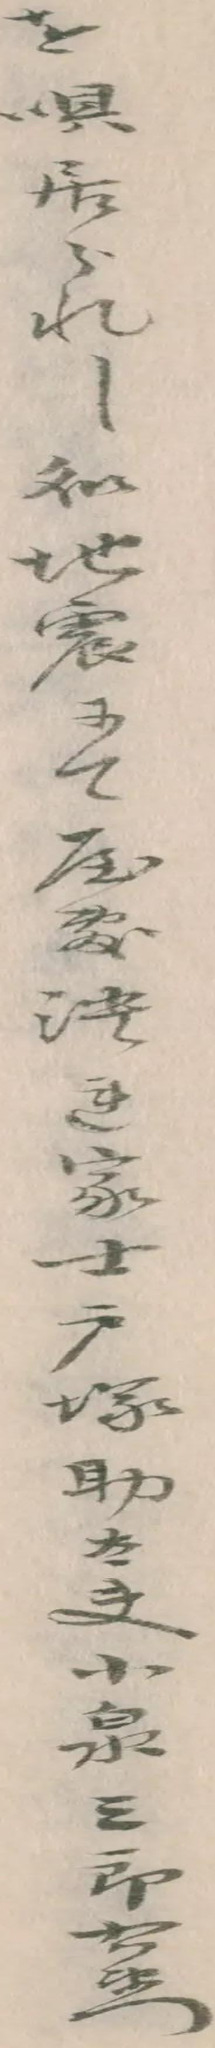を唄居られし処地震にて屋敷潰れ家士戸塚助太夫小泉三郎右衛門
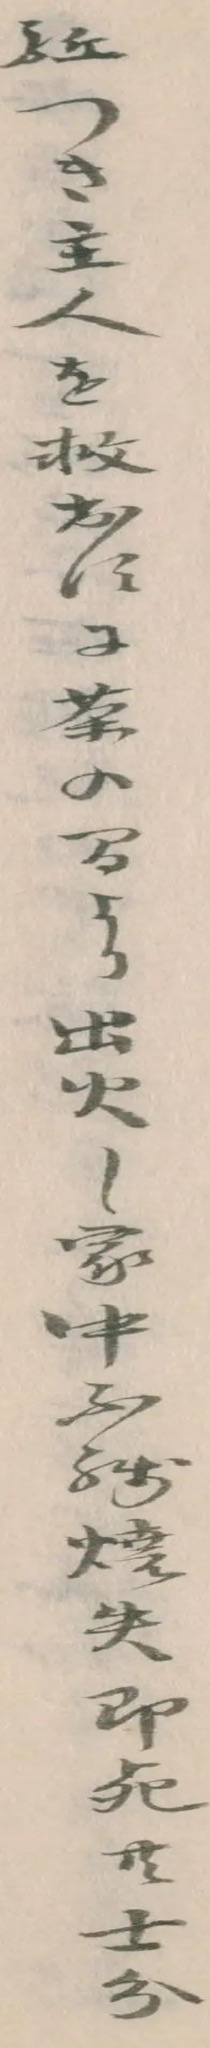駈つき主人を救出すに茶の間より出火し家中不残焼失即死共士分
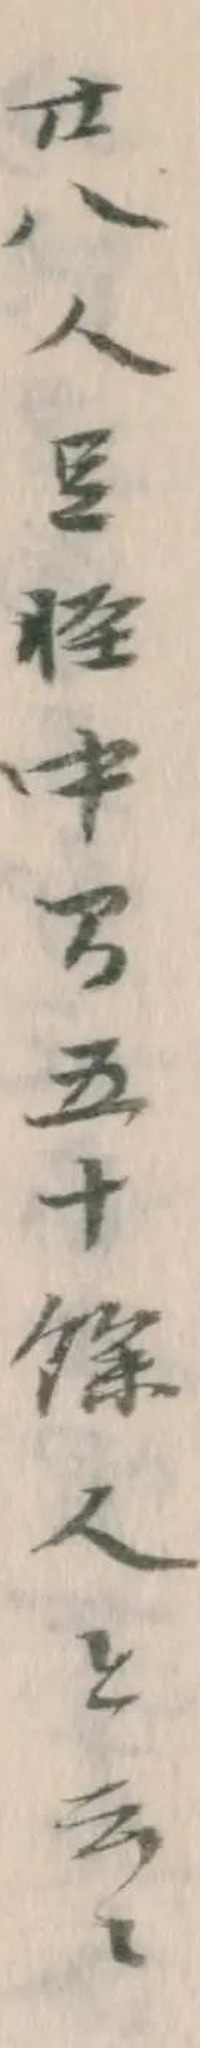廿八人足軽中間五十余人と云々
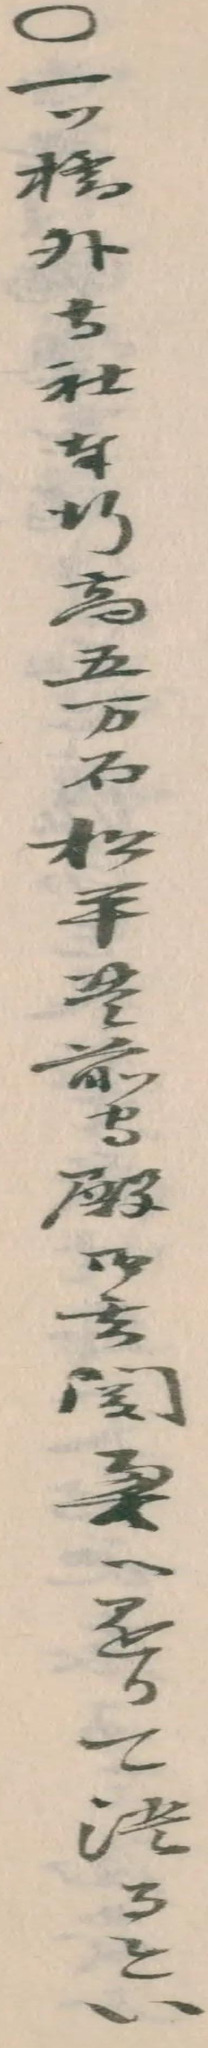〇一ツ橋外寺社奉行高五万石松平豊前守殿御玄関奥へ懸りて潰るとい
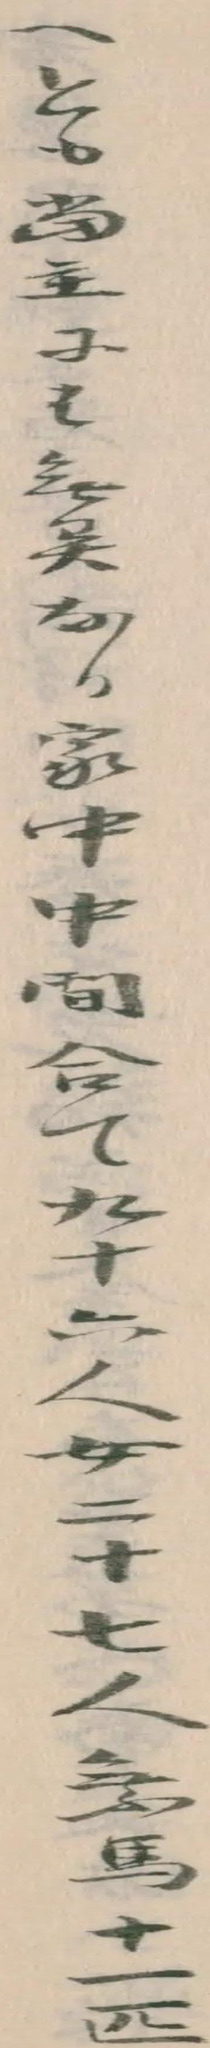へとも当主には無異なり家中中間合て九十六人女二十七人乗馬十一匹
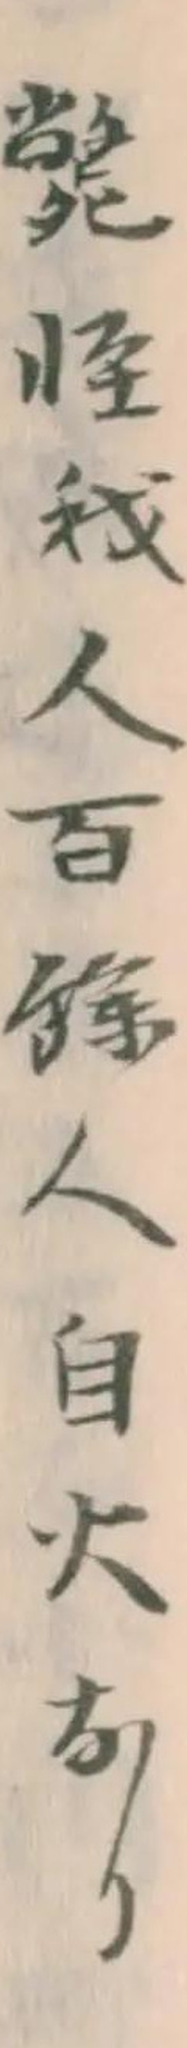斃怪我人百余人自火なり
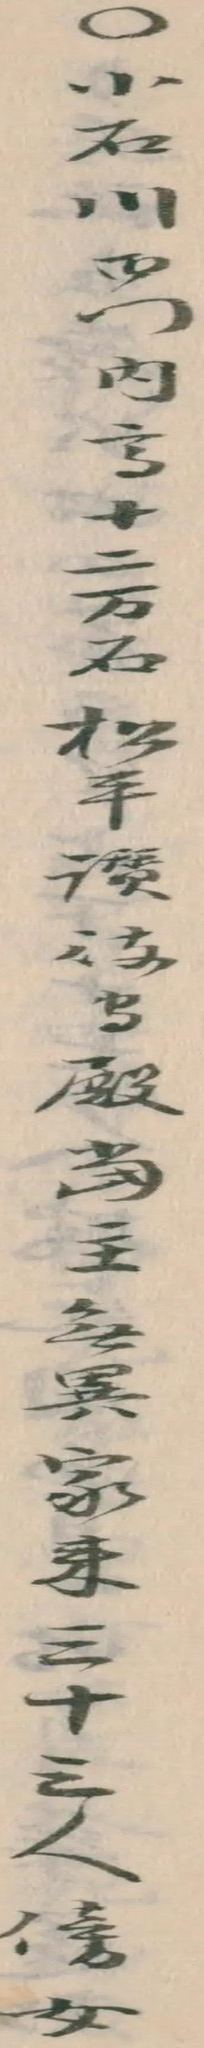〇小石川御門内高十二万石松平讃岐守殿当主無異家来三十三人傍女
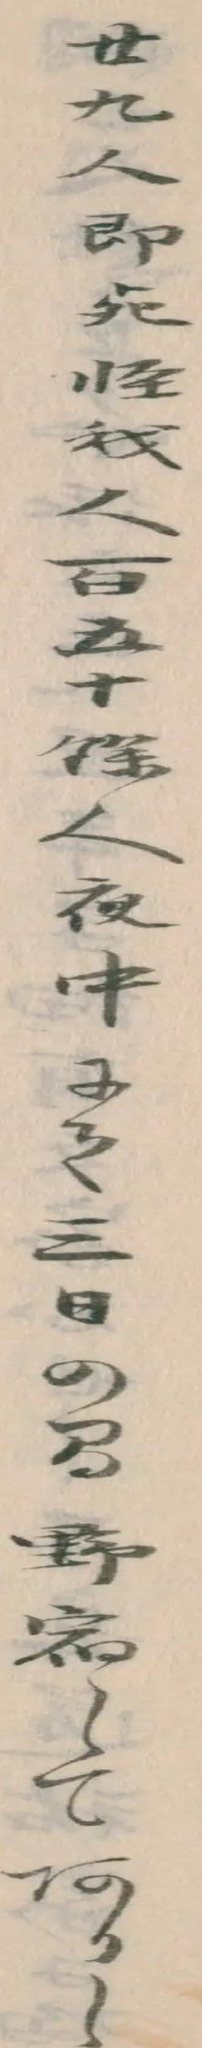廿九人即死怪我人百五十余人夜中にて三日の間野宿してありし
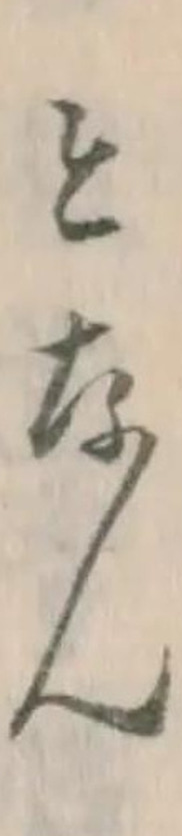となん
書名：地災撮要. 巻10(地震之部) 上,下
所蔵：国立国会図書館 National Diet Library, JAPAN
